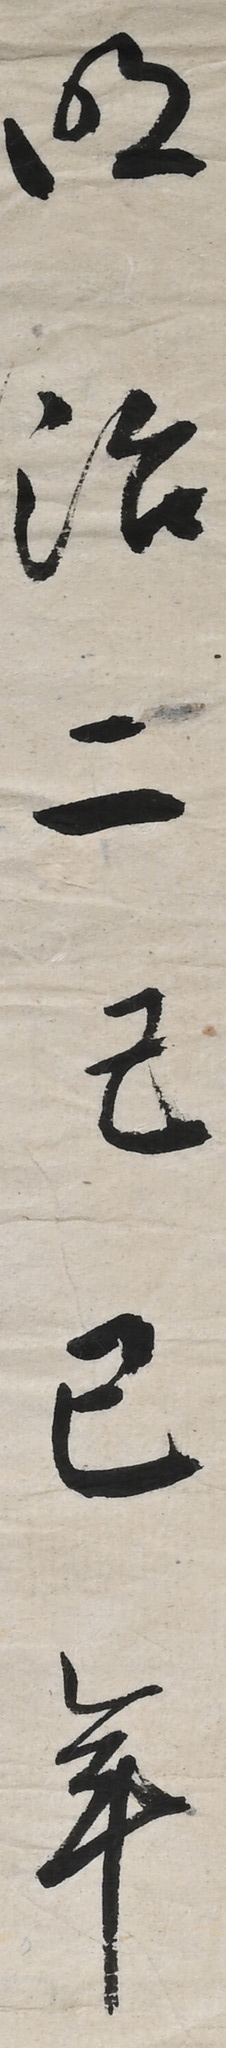明治二己巳年
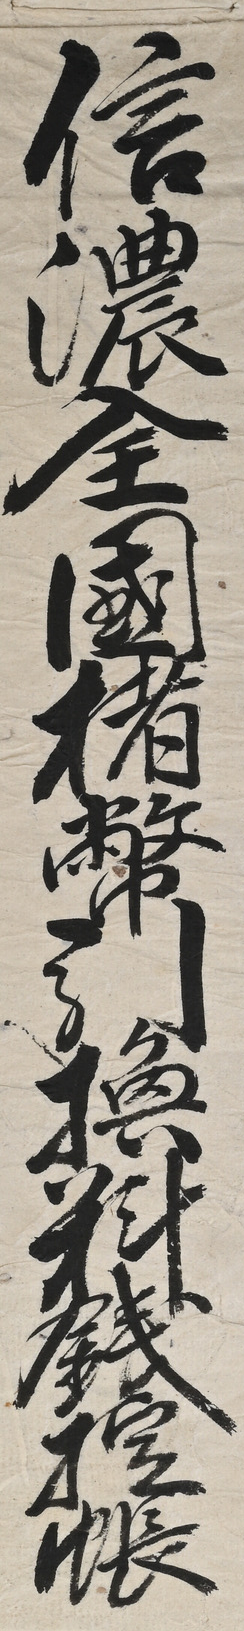信濃全国楮幣引換料銭控帳
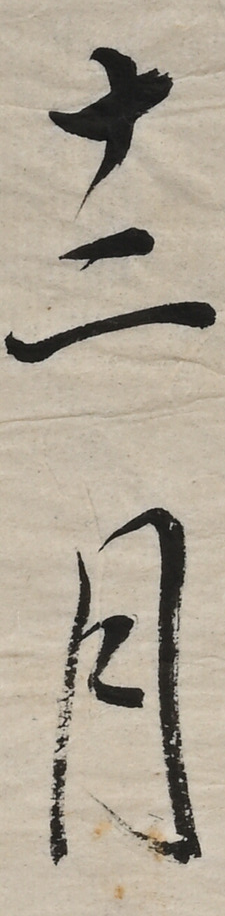十二月
